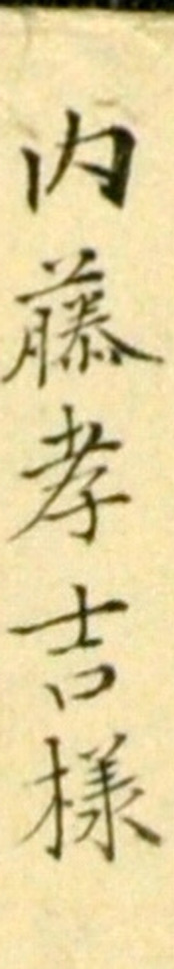内藤幸吉様
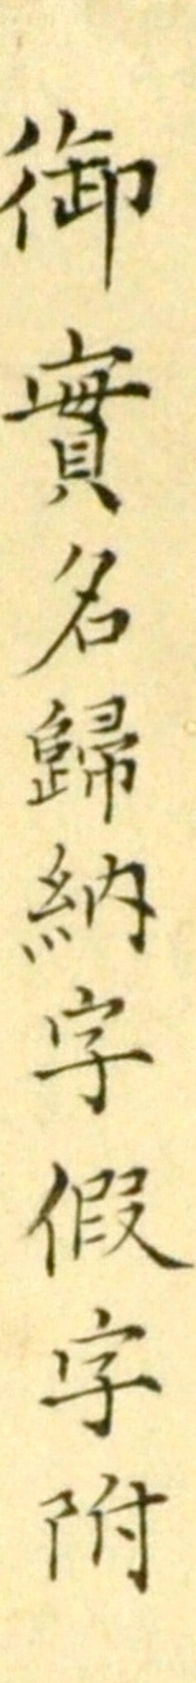御実名帰納字仮字附
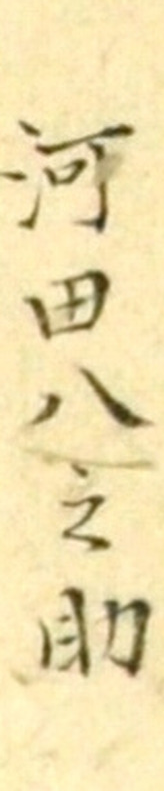河田八之助

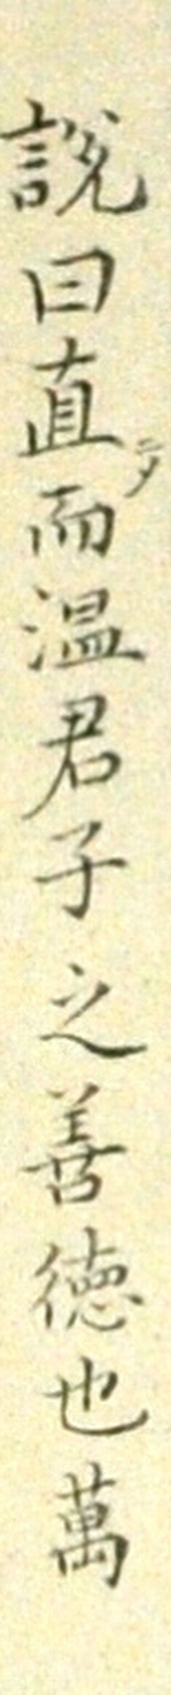説曰直而温君子之善徳也
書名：御実名帰納字仮字附
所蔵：伊那市立高遠町図書館・合同会社AMANE
